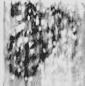○（荆）
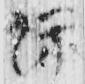𫵖
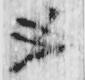之
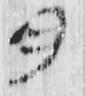月
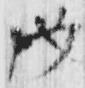戊
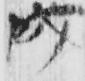戌
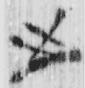之
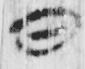日
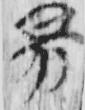昜（陽）
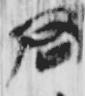君
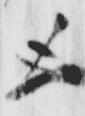之
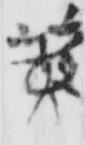蘭
